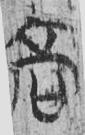高
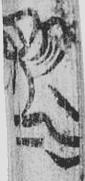測
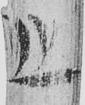之
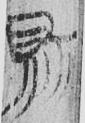則
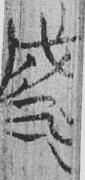○（滅）
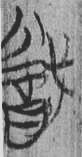○（察）
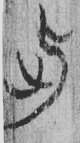此
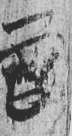言
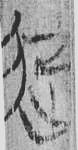○（起）
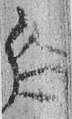於
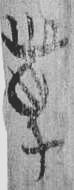○（一）
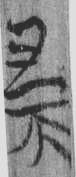耑（端）
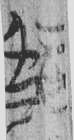○（聞）
